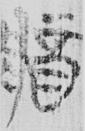𨟻（將）
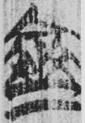與
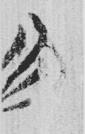勿
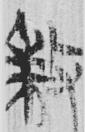殺
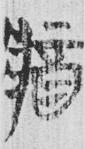𨟻（將）
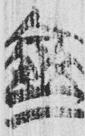齊
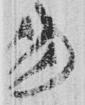勿
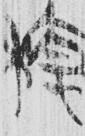桍（刳）
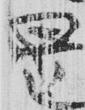是
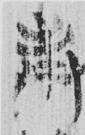奉（逢）
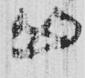凶
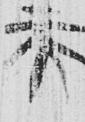天
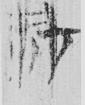○（災）
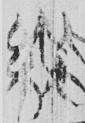繩繩
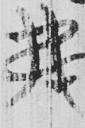弗
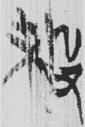○（滅）
